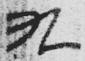九
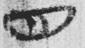四
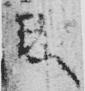畋
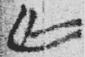亡（无）
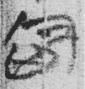○（禽）
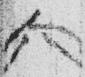六
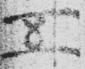五
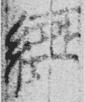恆
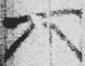亓（其）
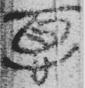惪（德）
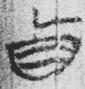貞
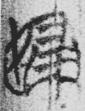婦
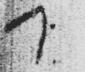人
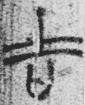吉
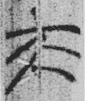夫
